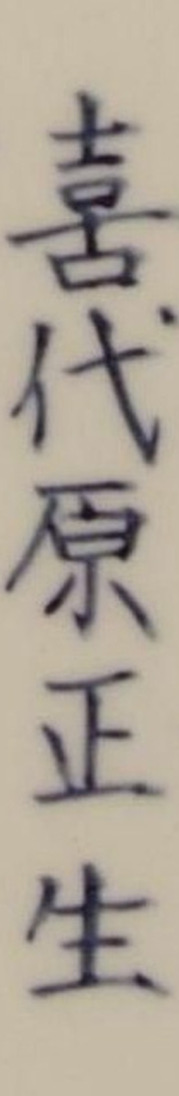喜代原正生
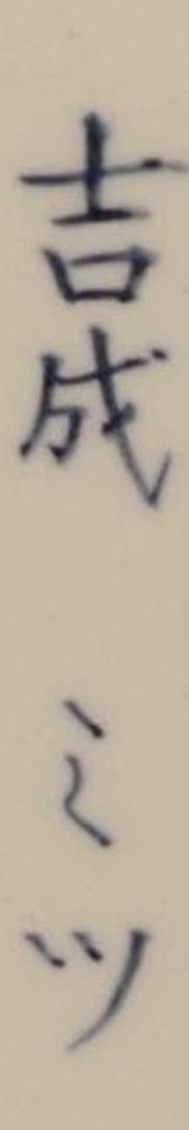吉成ミツ
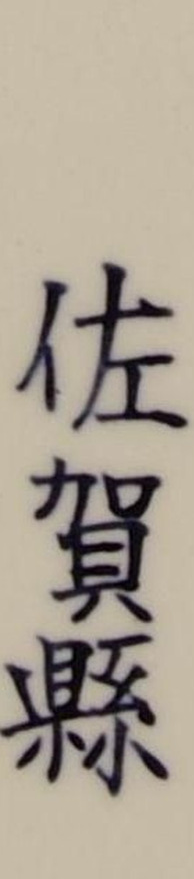＠佐賀県
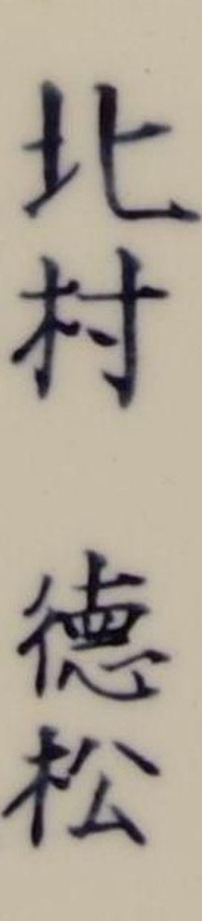北村徳松
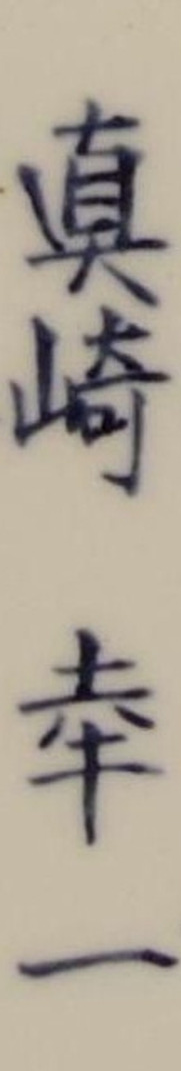真崎幸一
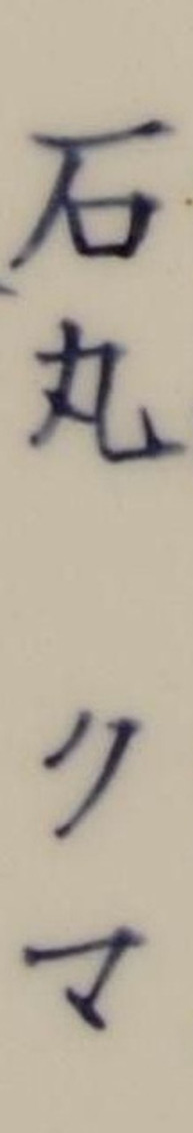石丸クマ
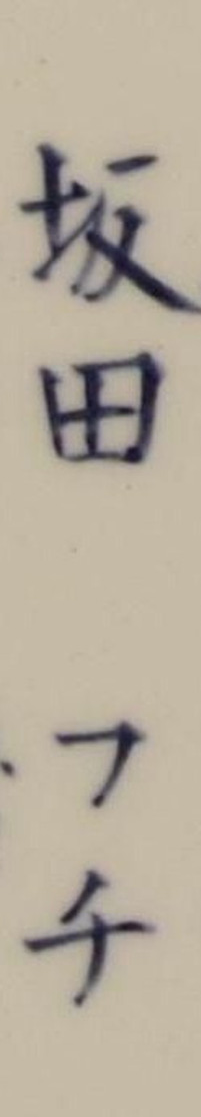坂田フチ
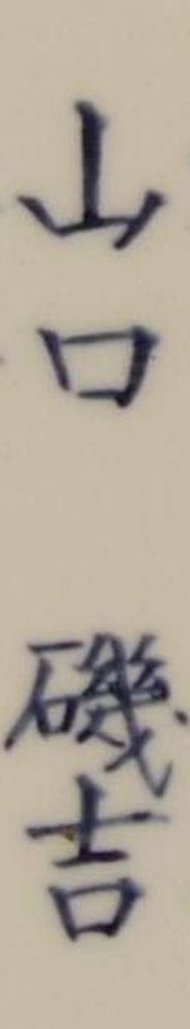山口磯吉
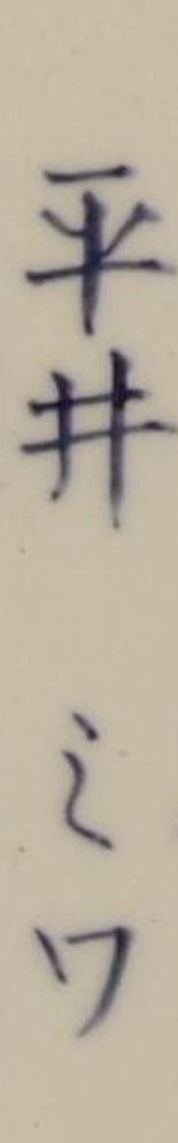平井ミワ
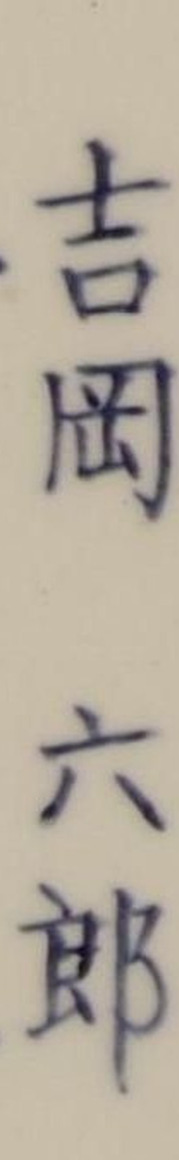吉岡六郎
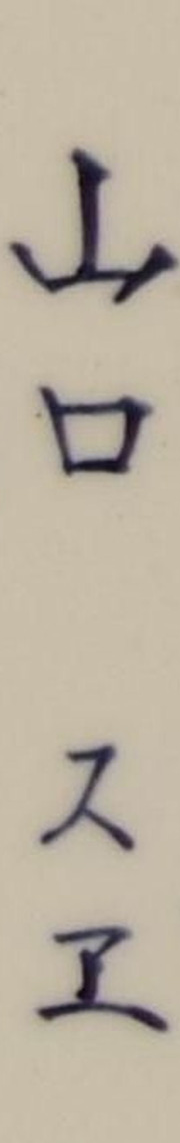山口スエ
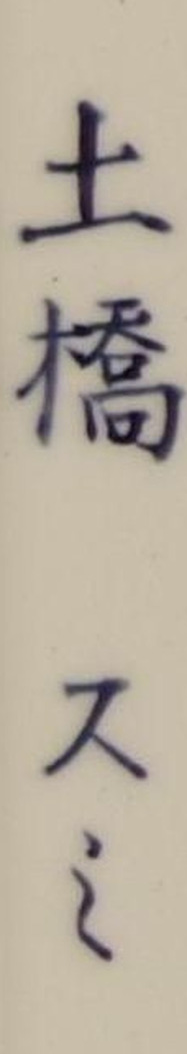土橋スミ

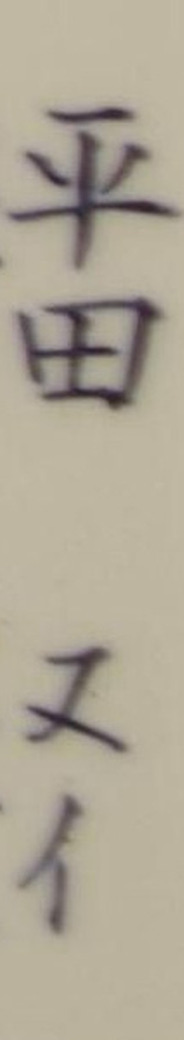平田ヌイ
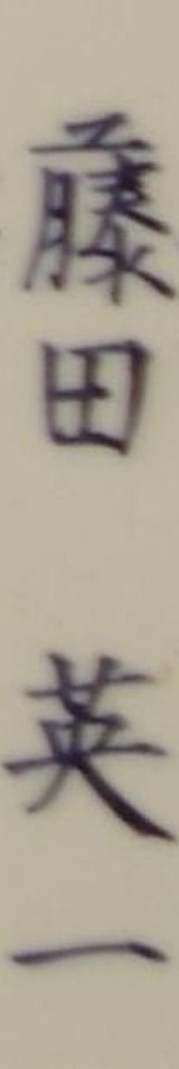藤田英一
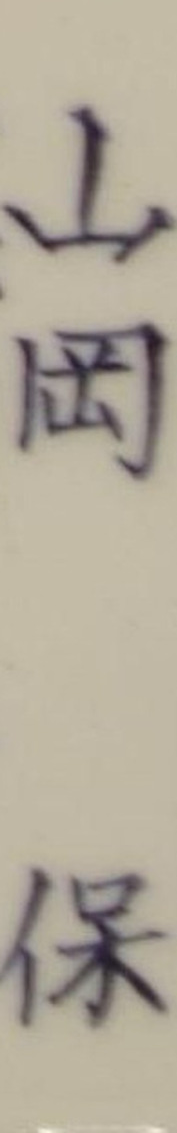山岡保
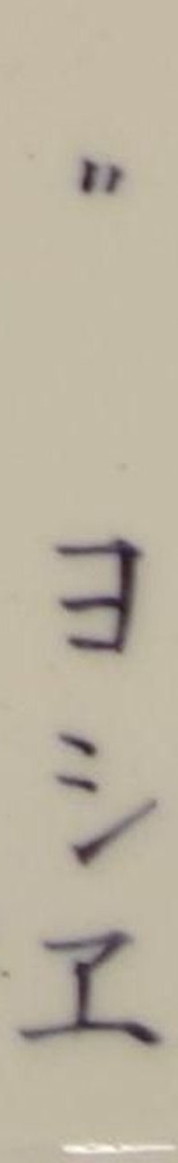ヨシヱ
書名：M~S
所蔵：高野山金剛峯寺
